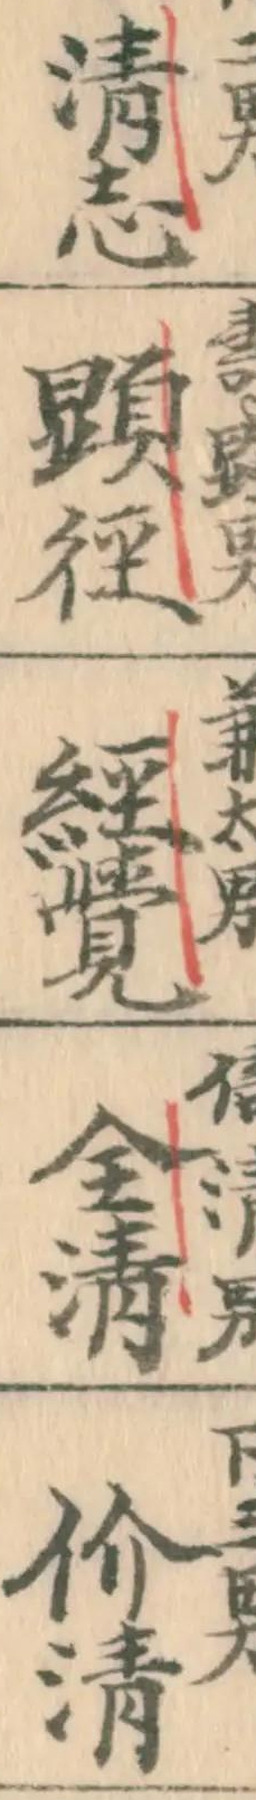清志顕径経覚全清价清
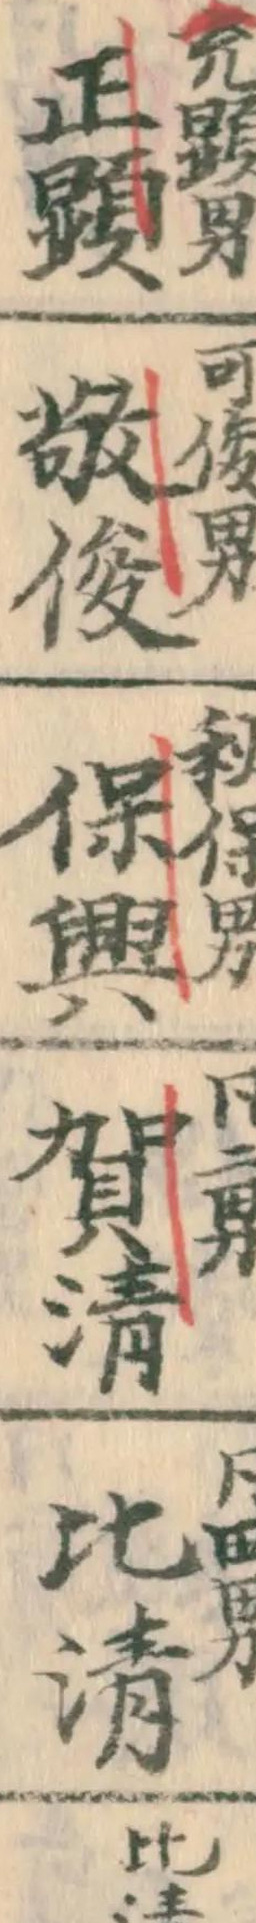正顕敬俊保興賀清比清
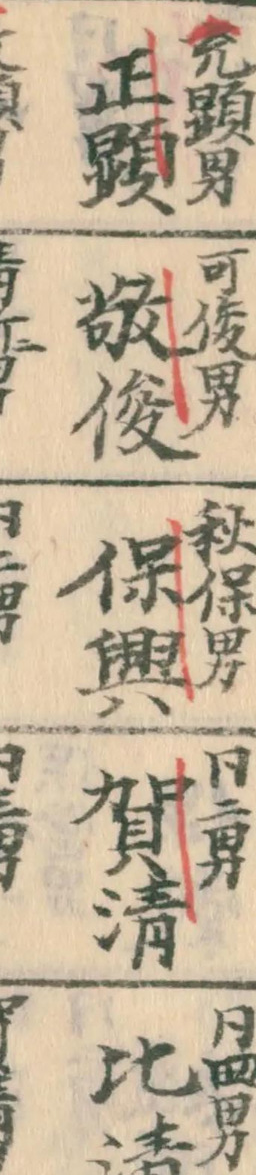正顕敬俊保興賀清比清
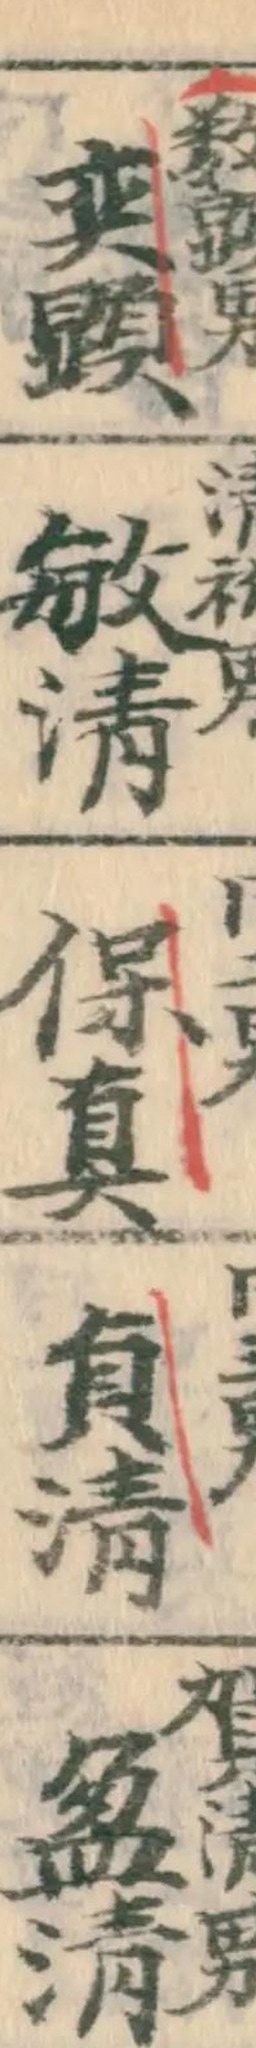奕顕敏清保真貞清盈清
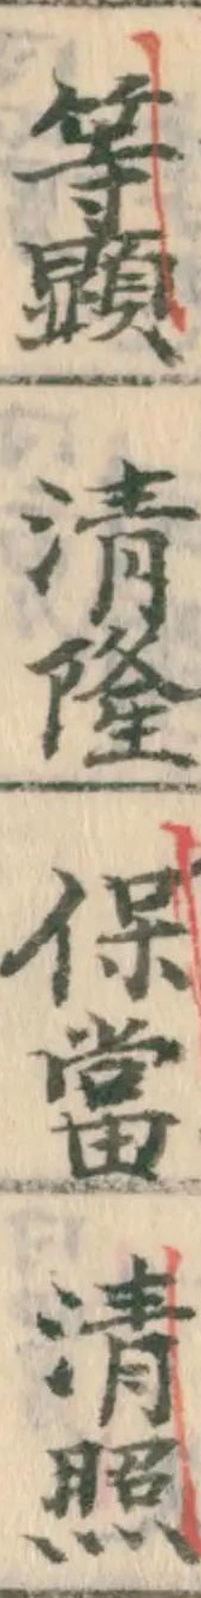等顕清隆保當清照
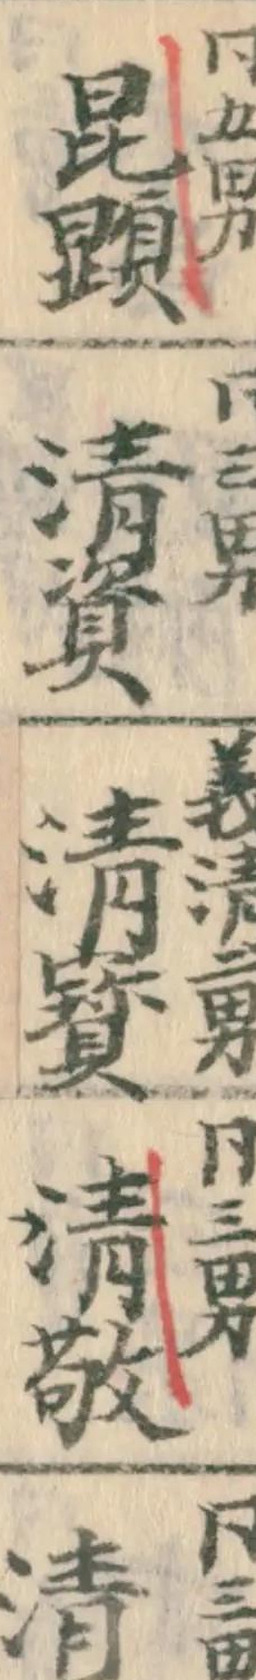昆顕清資清寶清敬清相

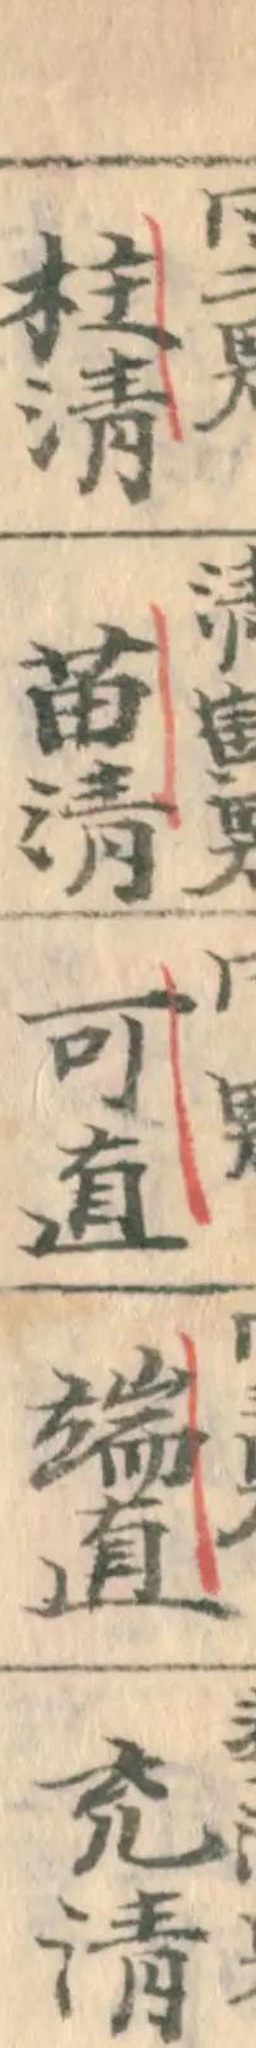柱清苗清可直端直充清
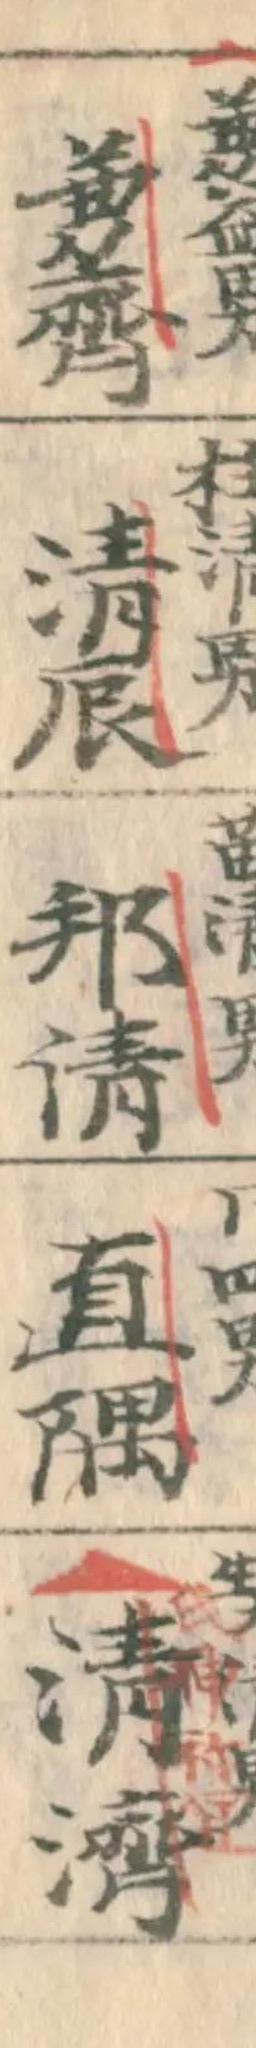兼齊清辰邦直直隅▲清濟
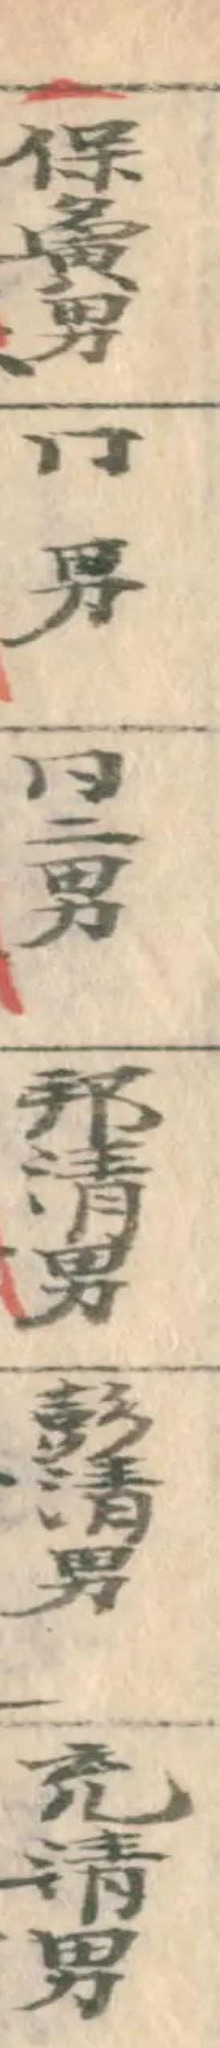▲保寅男同男同二男邦清男彭清男充清男
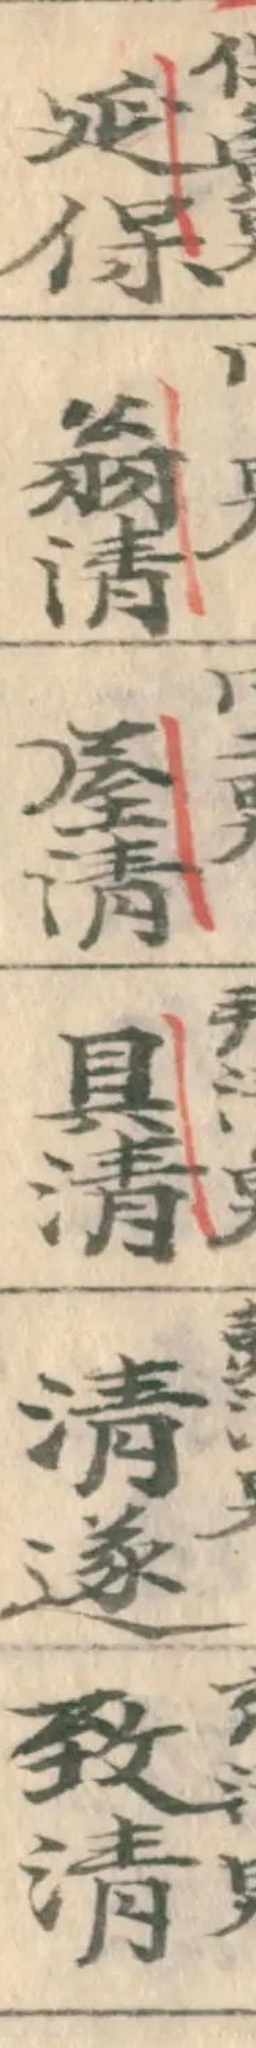延保翁清屋清具清清遂致清
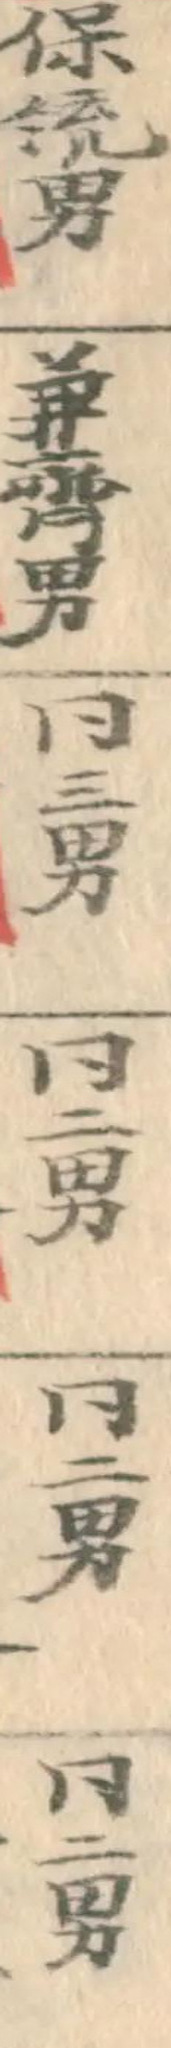▲保統男兼齊男同三男同二男同二男同二男
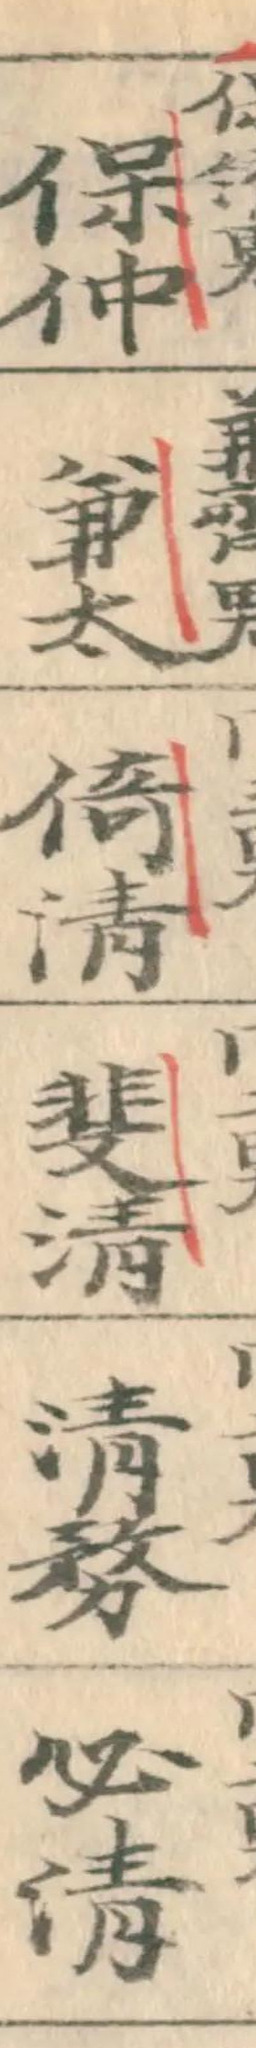保仲兼太倚清斐清清務必清
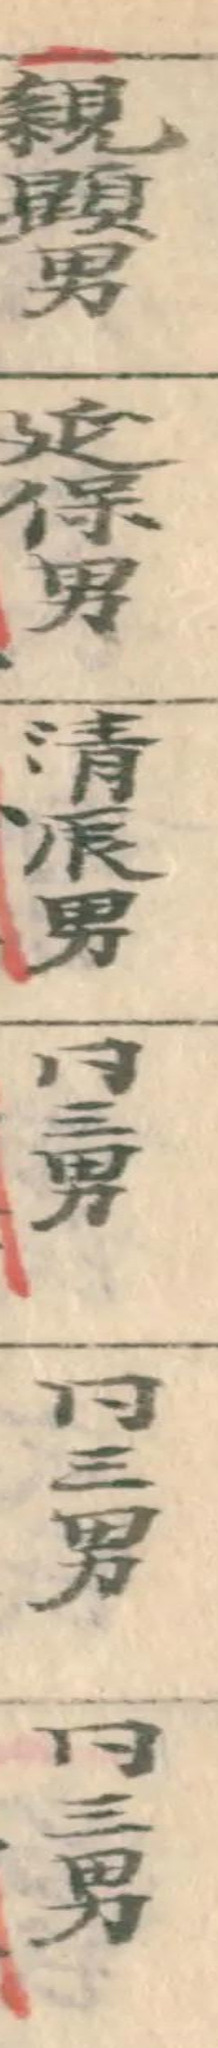▲親顕男延保男清辰男同三男同三男同三男
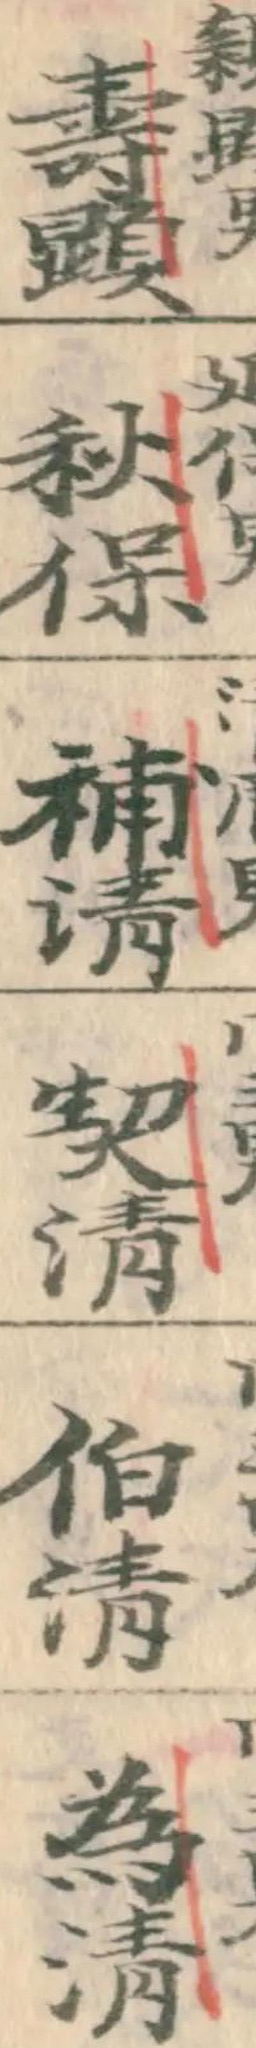壽顕秋保補清契清伯清為清
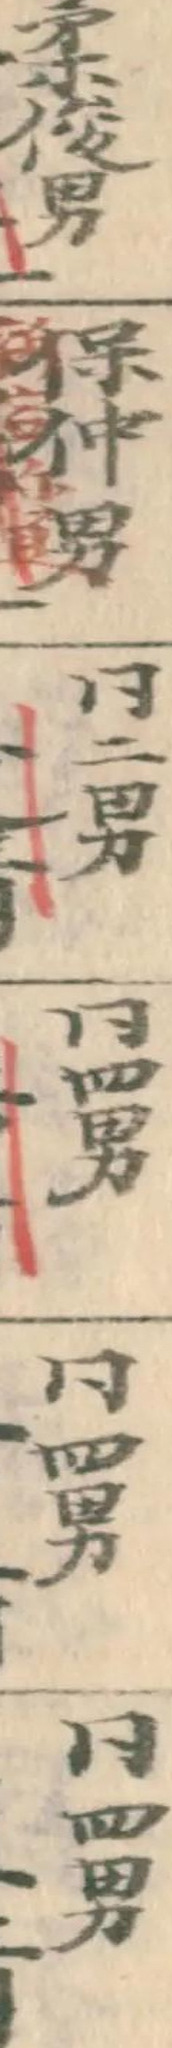▲柔俊男保仲男同二男同四男同四男同四男
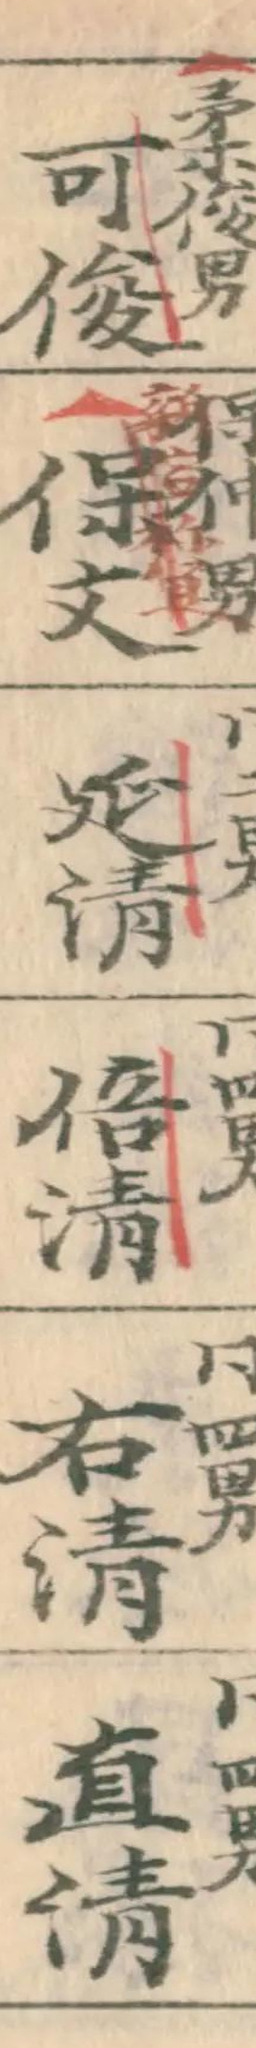可俊▲保文延清倍清右清直清
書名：賀茂社記録. 第24冊
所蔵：国立国会図書館 National Diet Library, JAPAN
